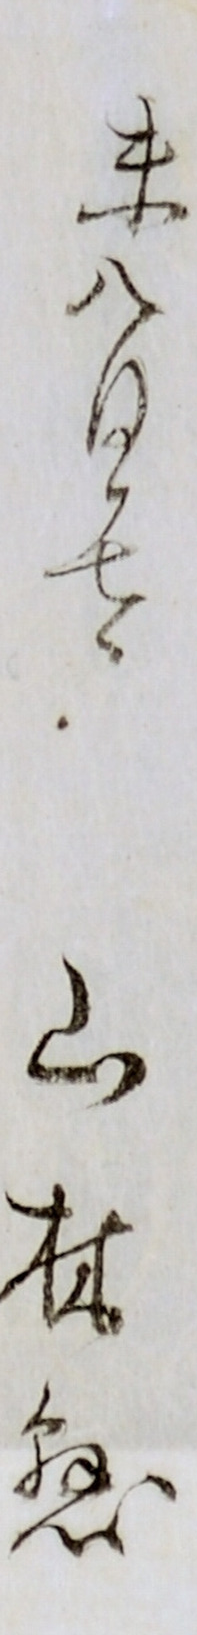未八月十七日山林懸
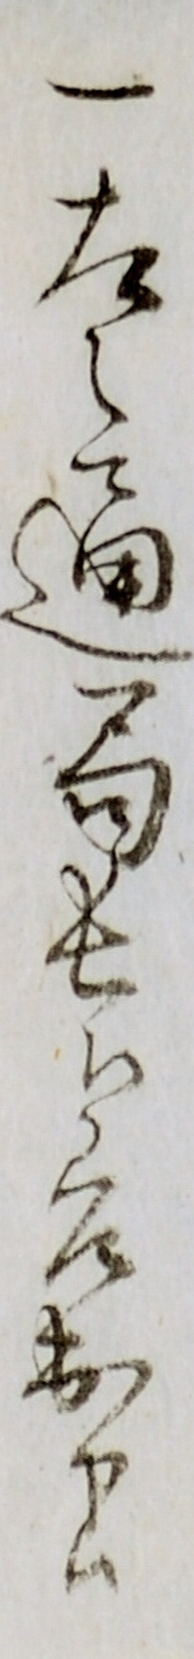一左之通局長え差出申候
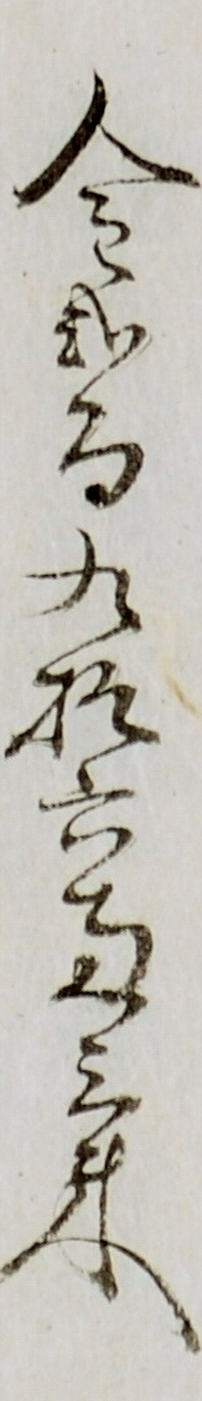金弐百九拾六両三朱
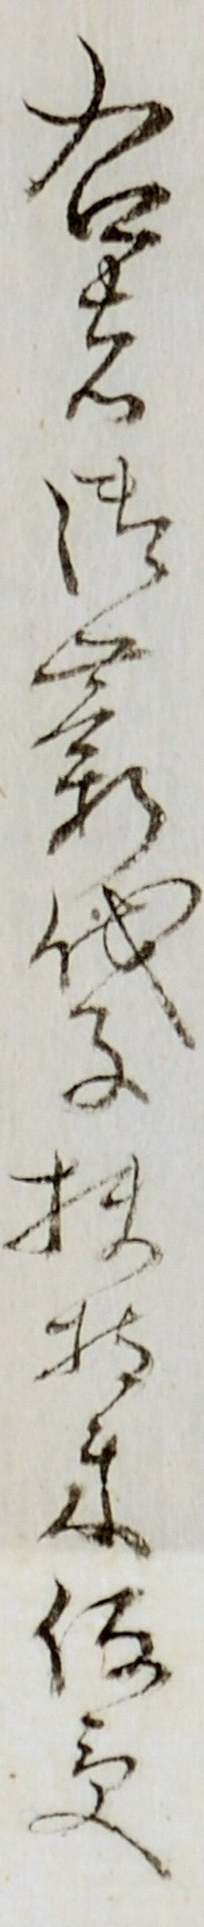右は御薪伐子扶持米仮受
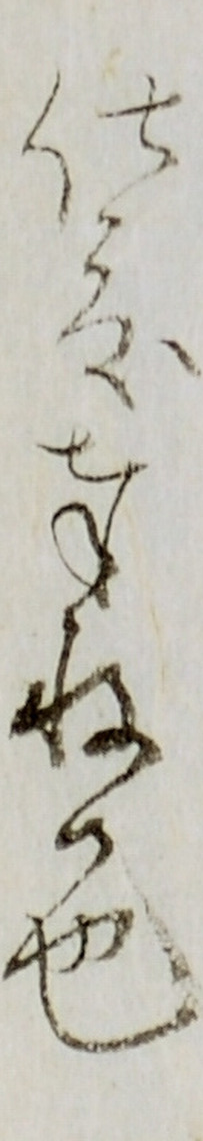仕度奉存候也
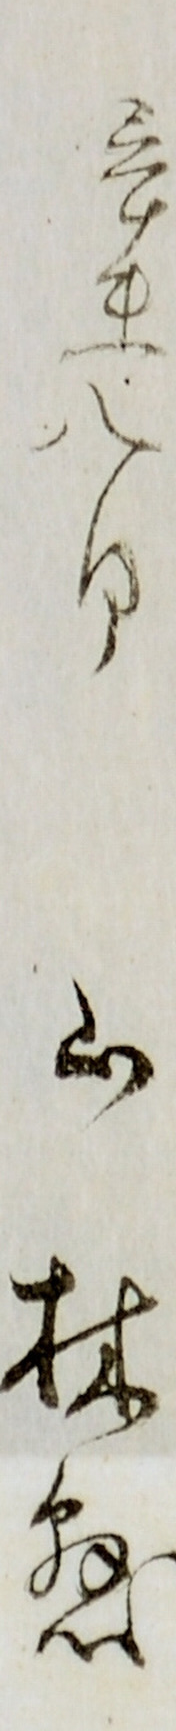辛未八月山林懸
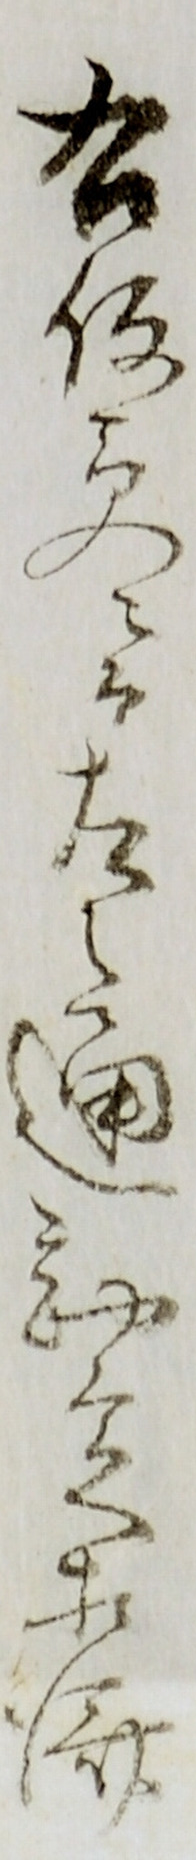右仮受にて左之通勘定相済
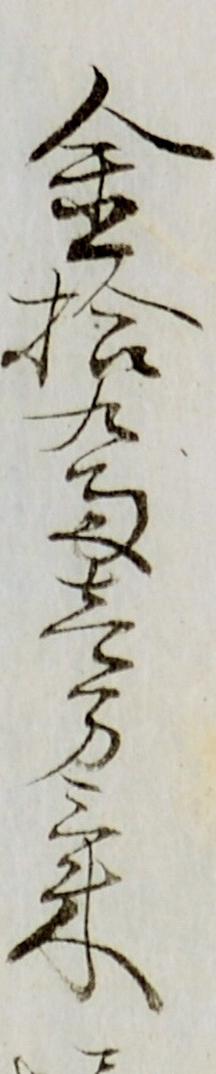金弐拾五両壱分三朱
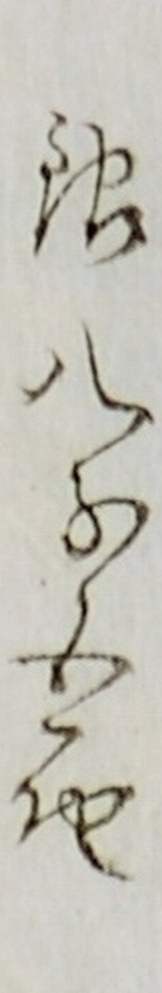銀八分五厘
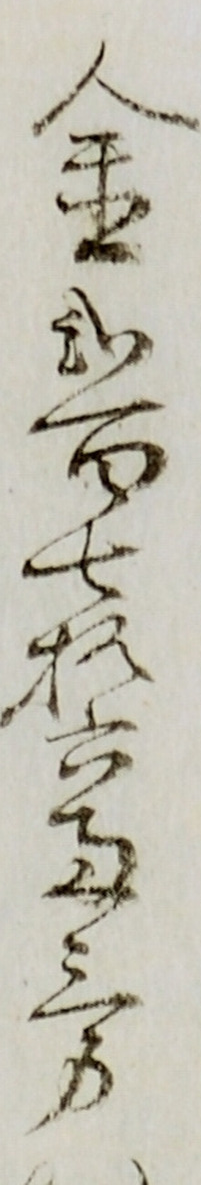金弐百九拾六両三朱
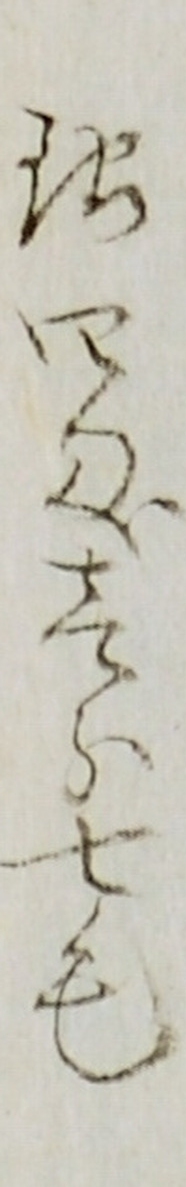銀四匁壱分七毛
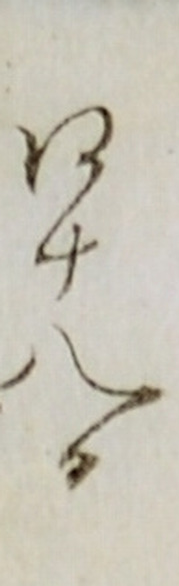同十八日
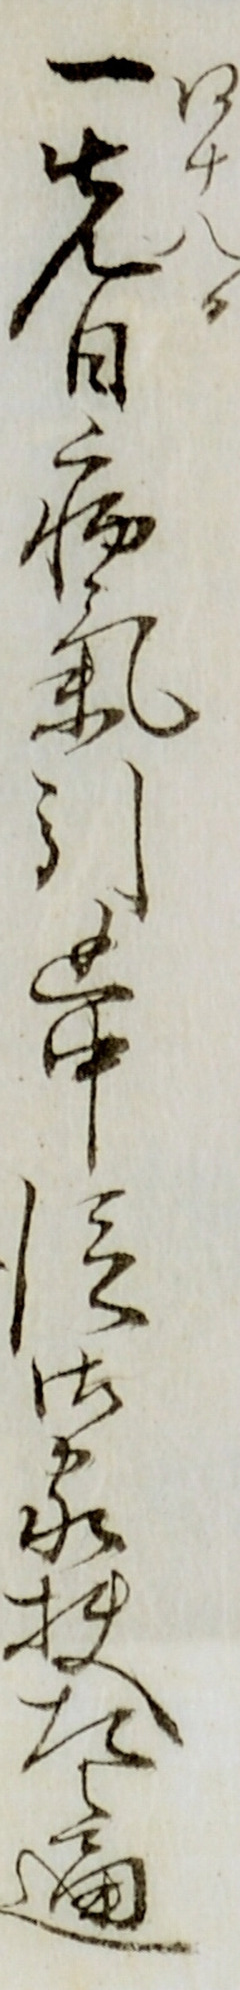一先日病気引込中従御家扶左之通
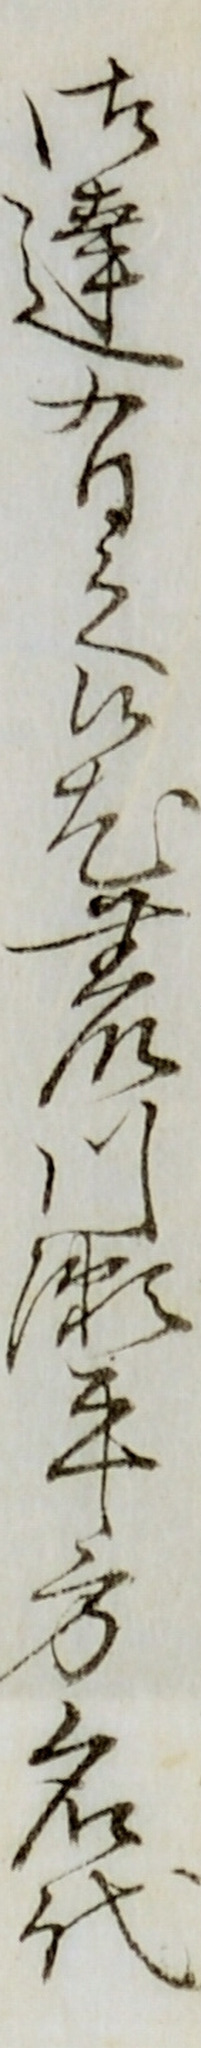御達有之候尤荒川瀬平方名代
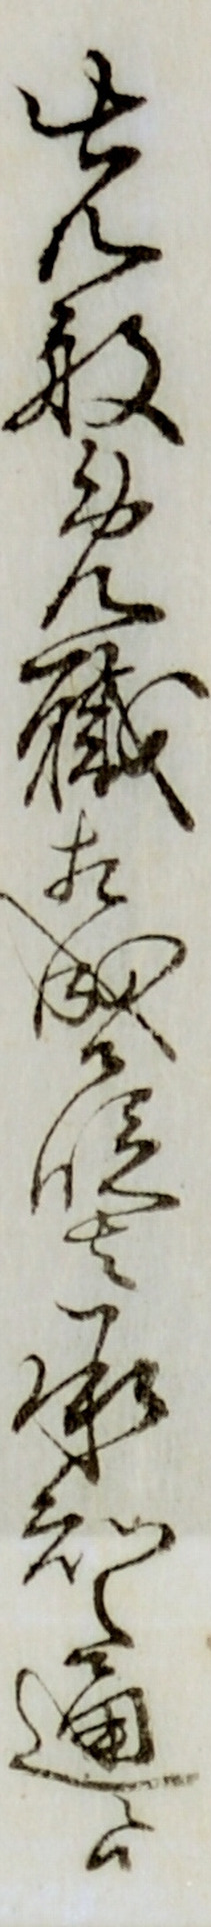先般免職相成候段は承知之通に候
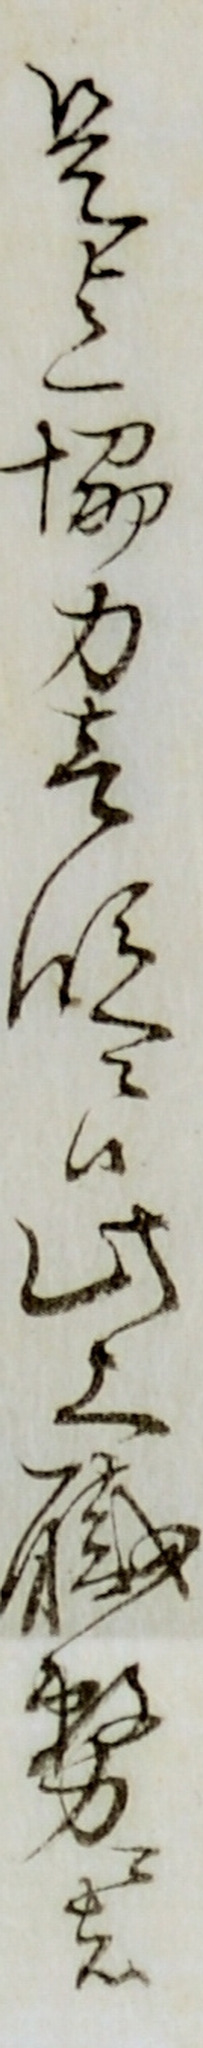是迄協力壱段に候此上職務には
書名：山林方諸事御用留
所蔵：伊那市立高遠町図書館・合同会社AMANE
